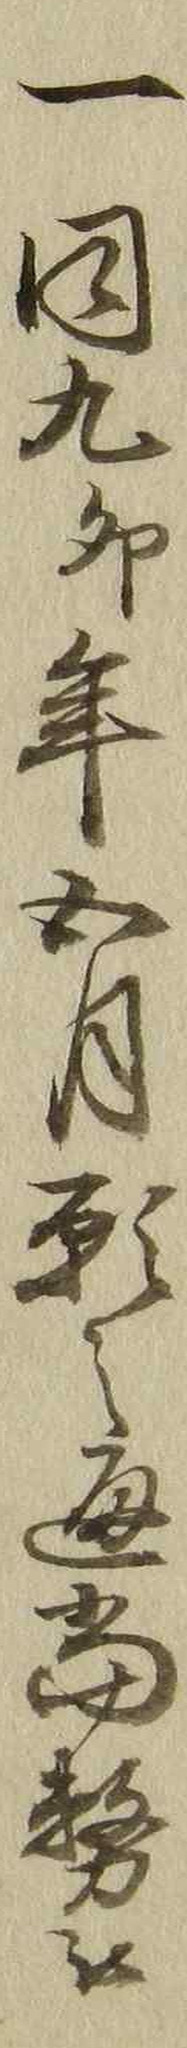一同九卯年五月願之通当務被
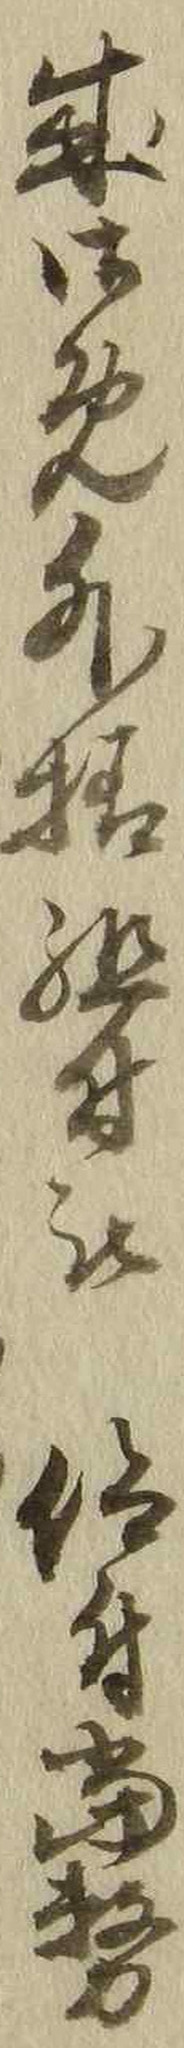成御免外様組付被仰付当務
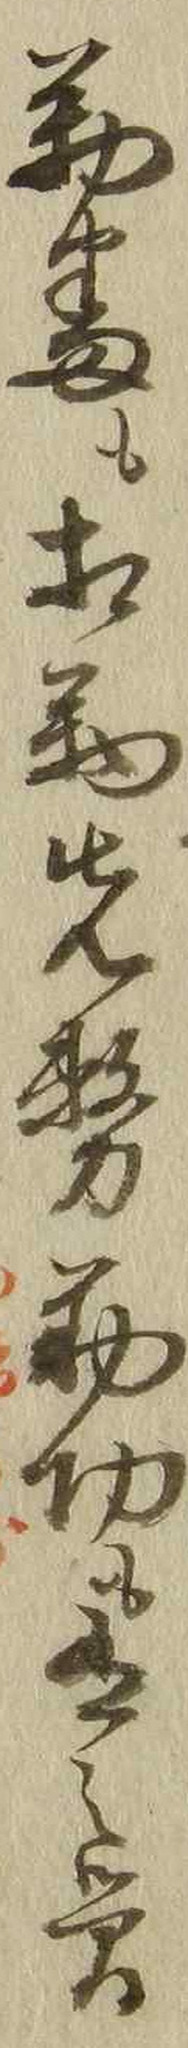勤番も相勤先務勤功も有之候間
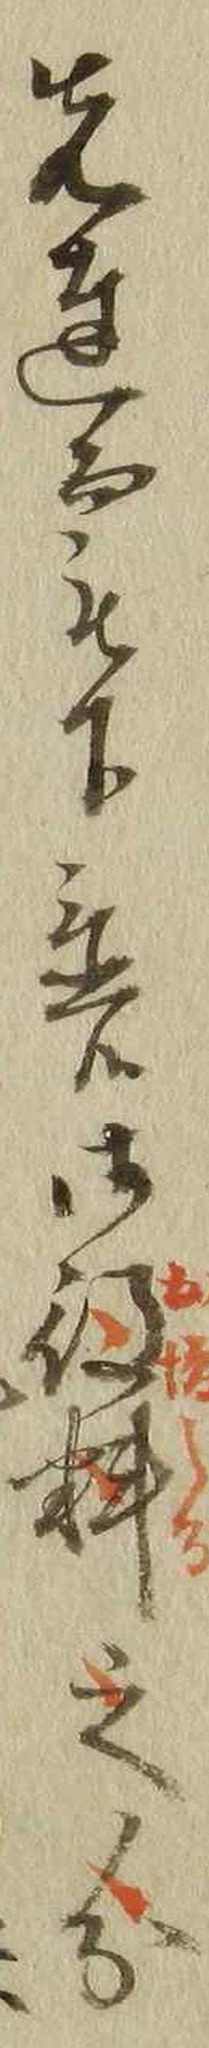先達而被下置候御役料之分
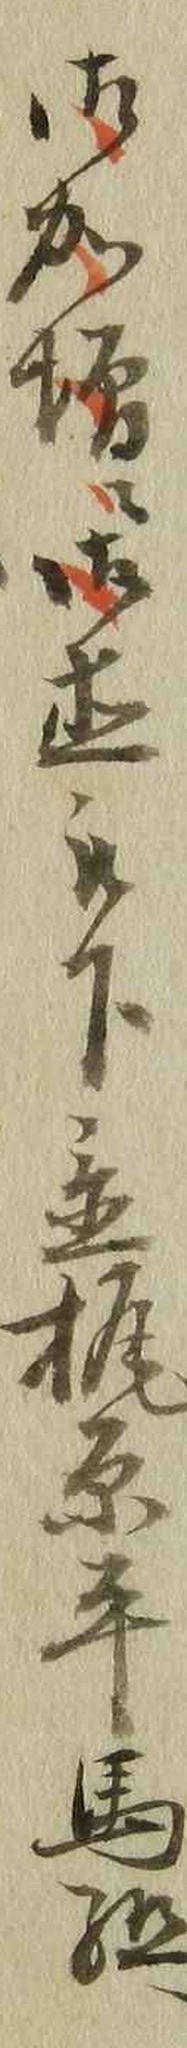御加増ニ御直被下置梶原平馬組ヘ
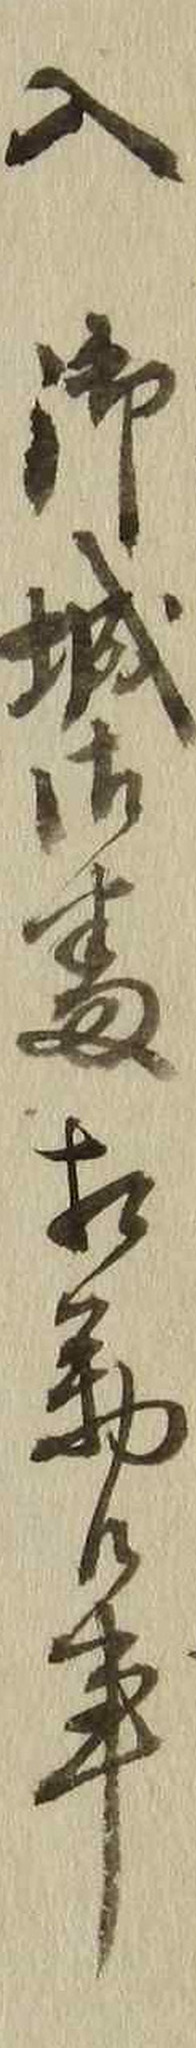入御城御番相勤候事
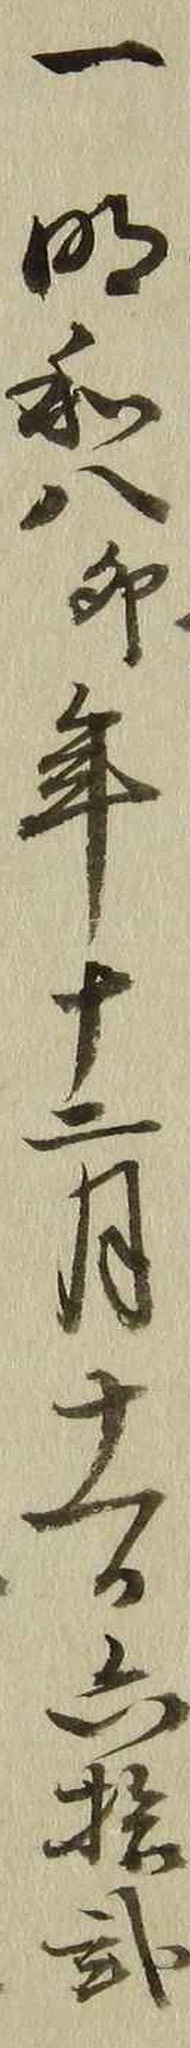一明和八卯年十二月十一日六拾弐
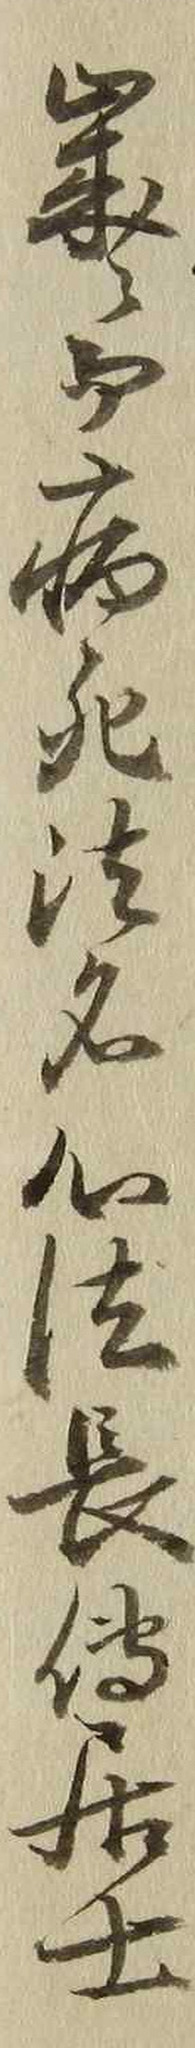歳ニ而病死法名心法長傳居士
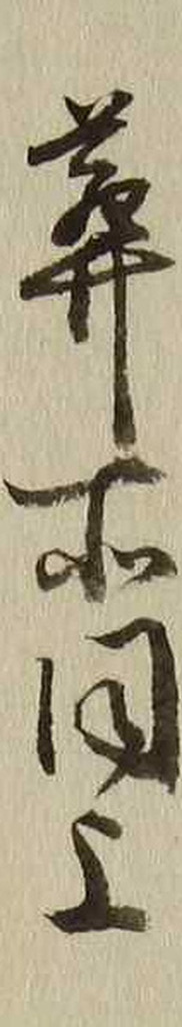葬所同上
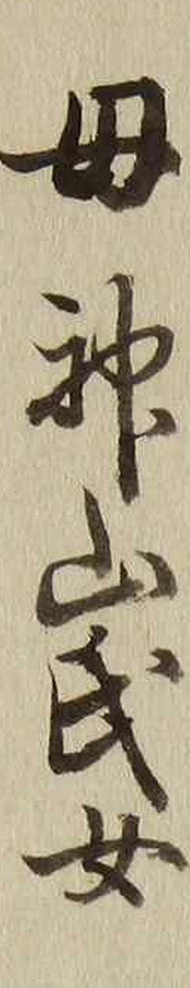母神山氏女
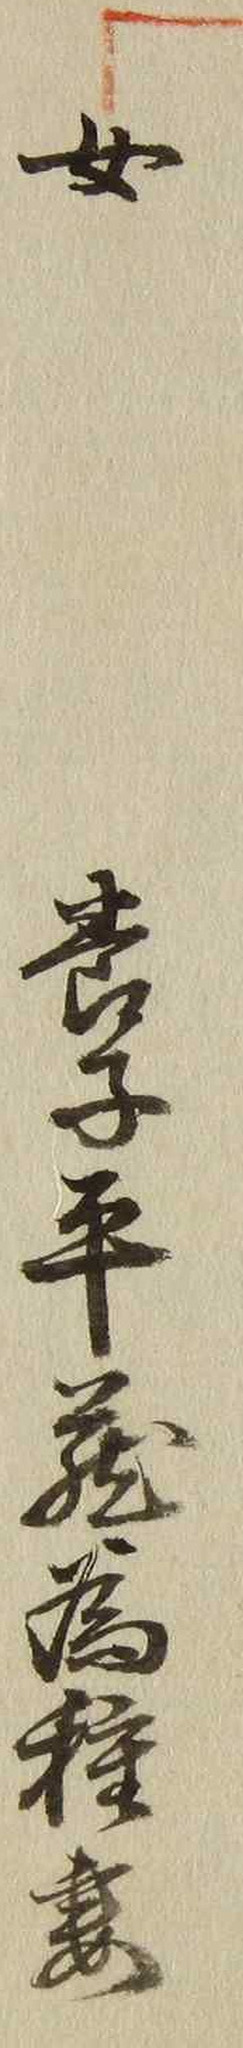女養子平蔵為種妻
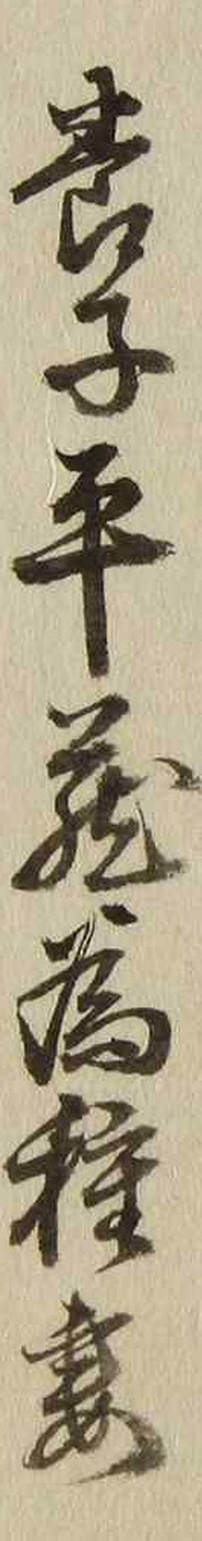女養子平蔵為種妻
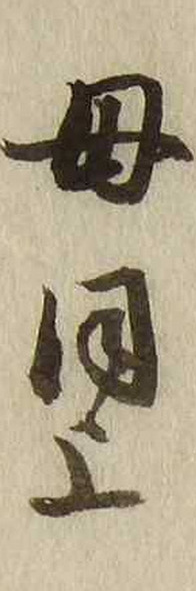母同上

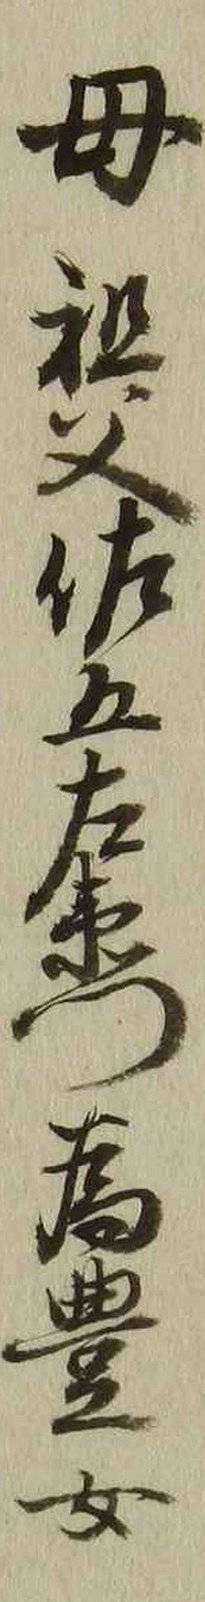母祖父佐五左衛門為豊女
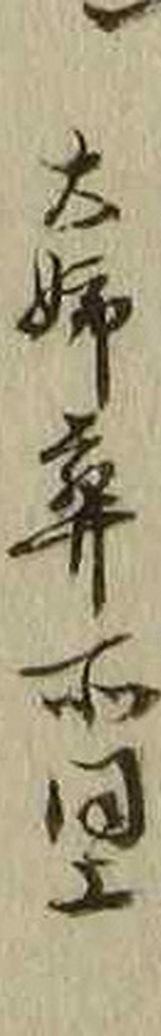大姉葬所同上
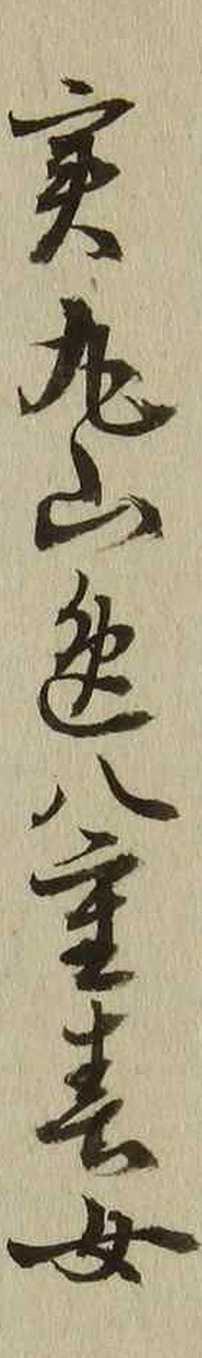実丸山逸八重春女
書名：諸士系譜　巻之64　と之部7
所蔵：会津若松市立会津図書館
